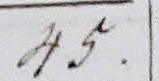45.
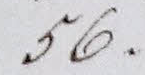56
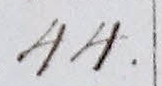44.
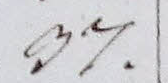37.
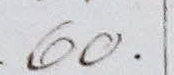60.
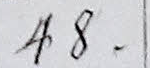48.
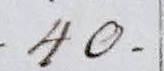40.
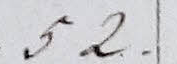52.
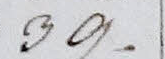39.
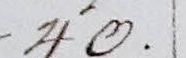40.
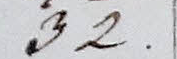32.
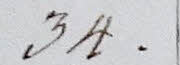34.
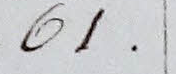61.
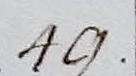49
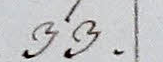33.
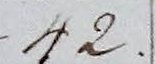42
